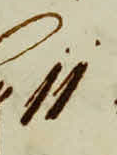11
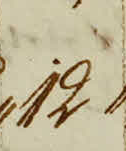12
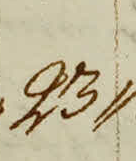23
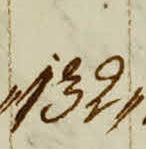132
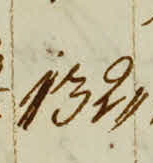132
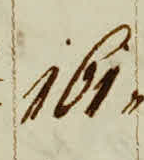161
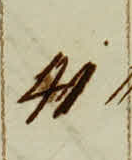41
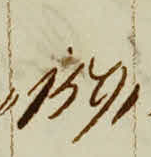159
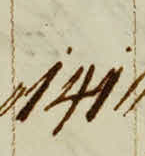141
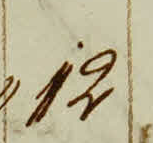12
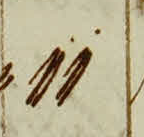11
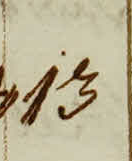13
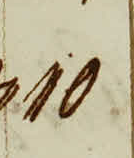10
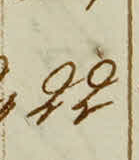22
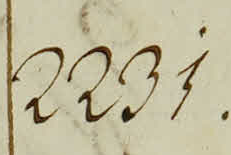2231
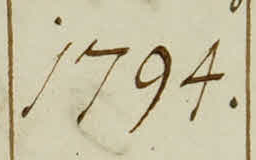1794
